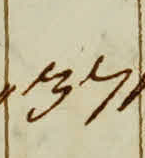37
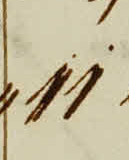11
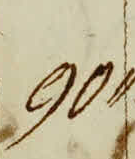90
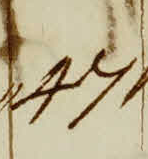47
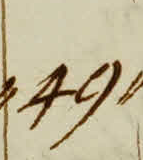49
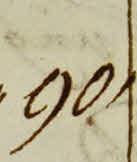90
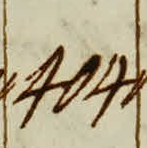404
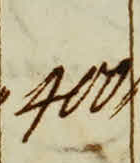400
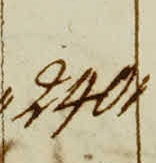240
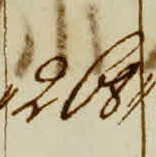268
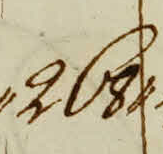268
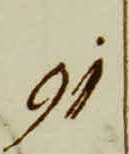91
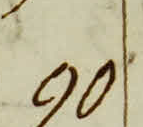90
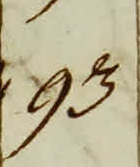93
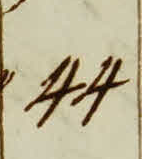44
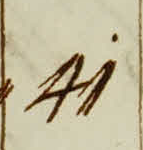41
